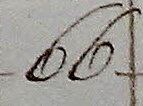66
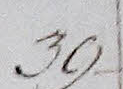39
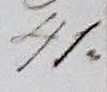41
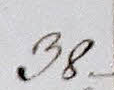38
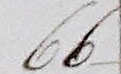66
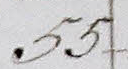55
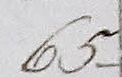65
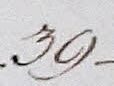39
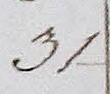31
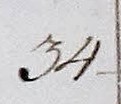34
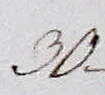30
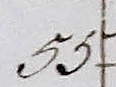55
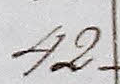42
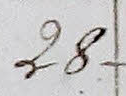28
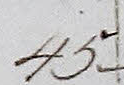45
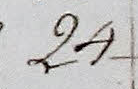24
